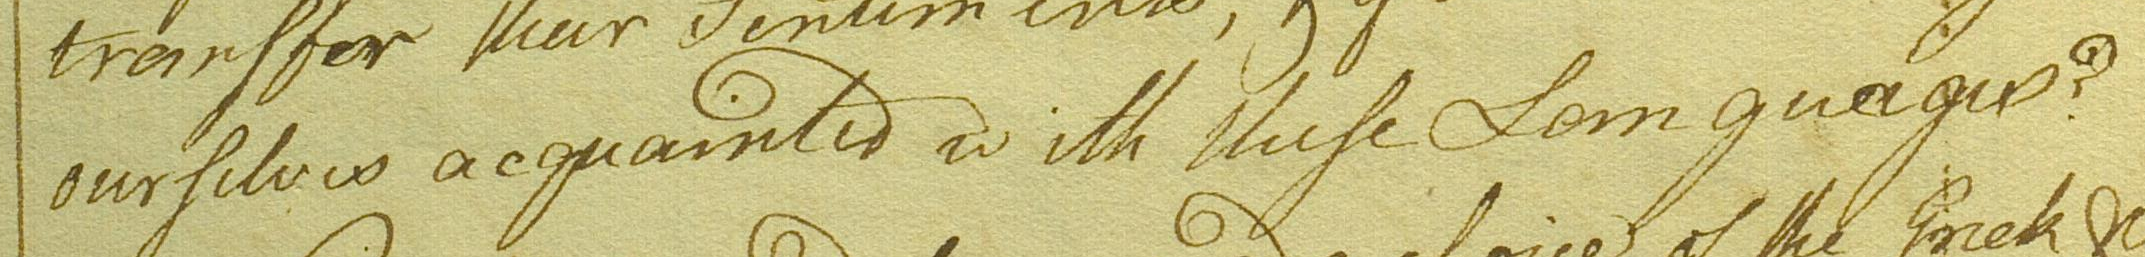ourselves acquainted with these Languages?
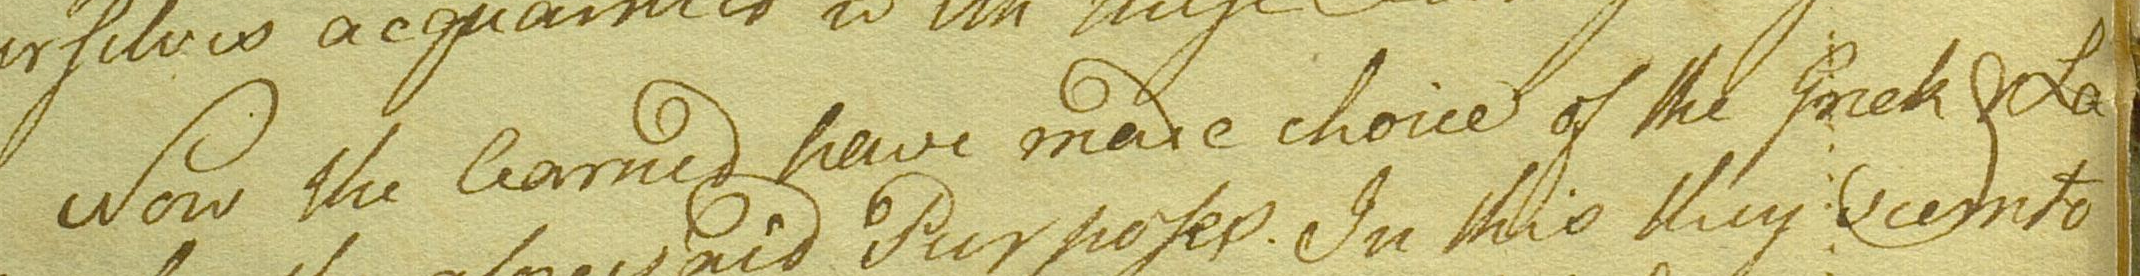Now the learned have made choice of the Greek & La
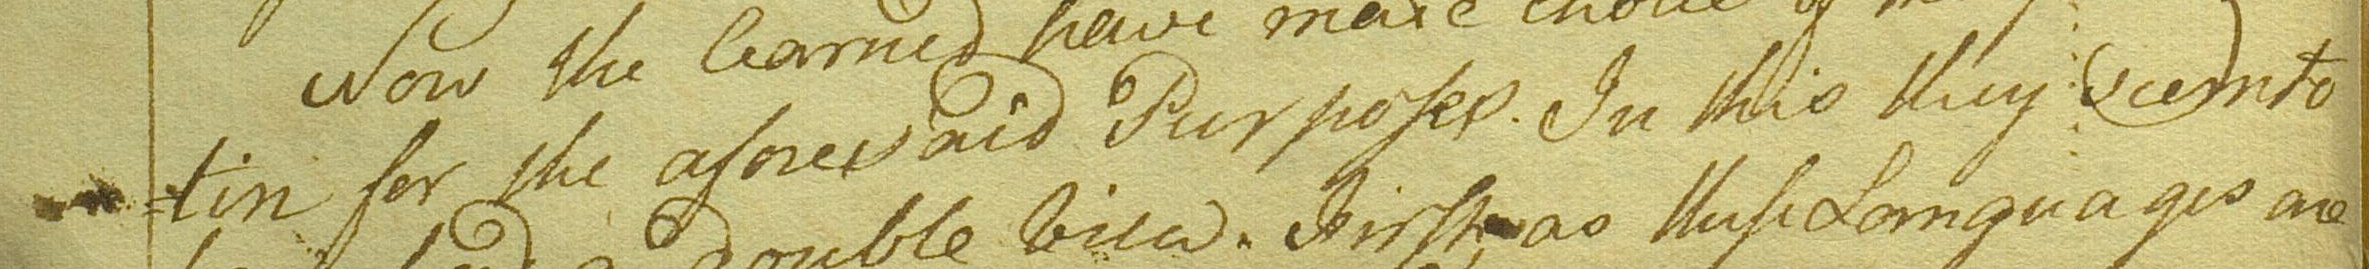-tin for the aforesaid Purposes. In this they seem to
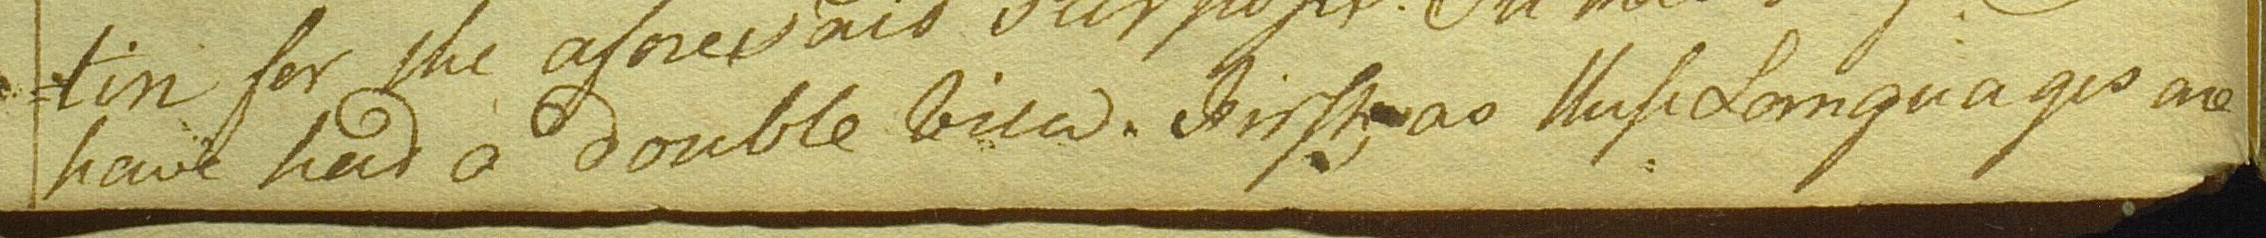have had a double view. First as these Languages are
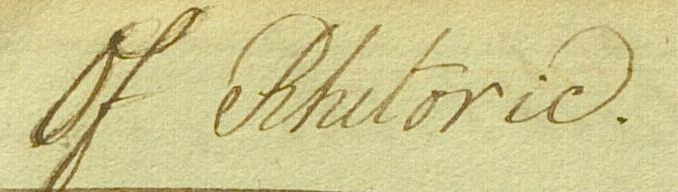Of Rhetoric.
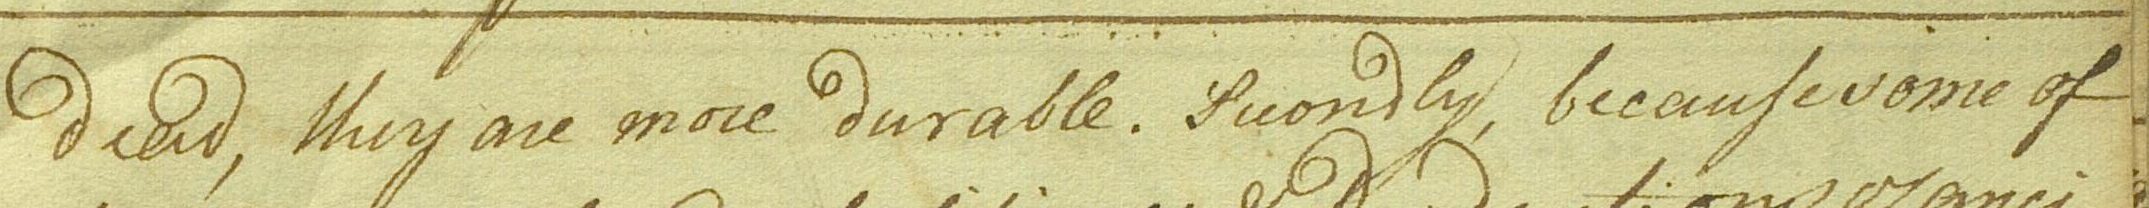dead, they are more durable. Secondly, because some of
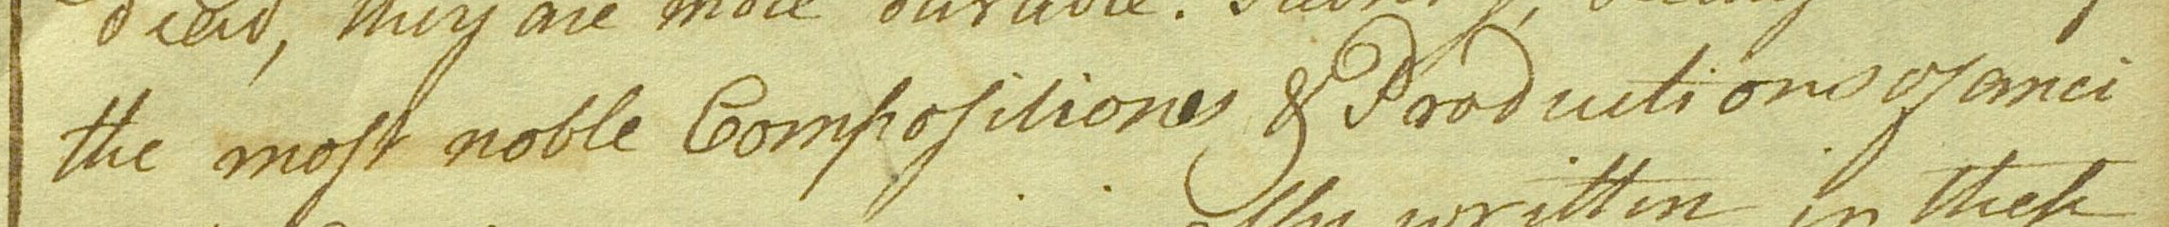the most noble Compositions & Productions of anci
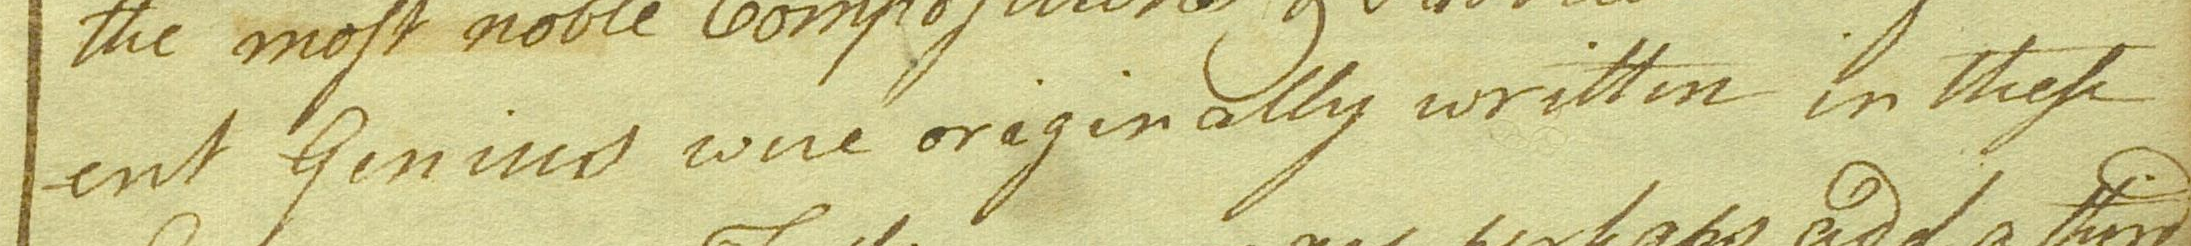-ent Genius were originally written in these
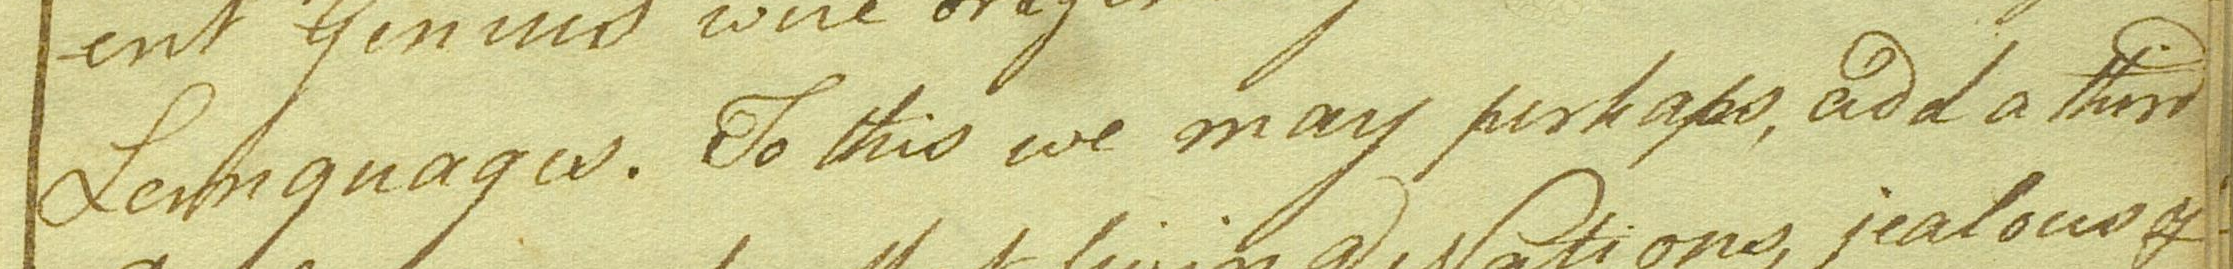Languages. To this we may perhaps, add a third
